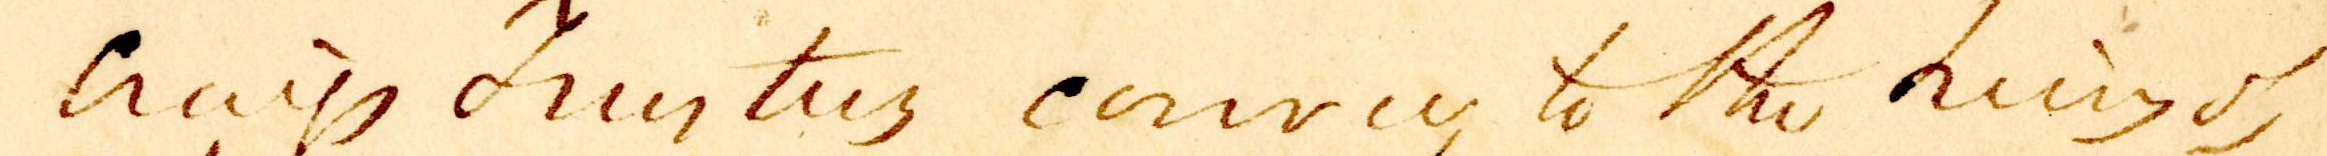Craigs Tractes convey to the Lines of
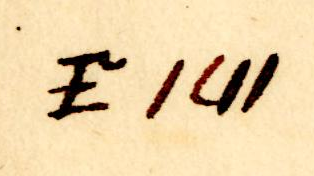E 141
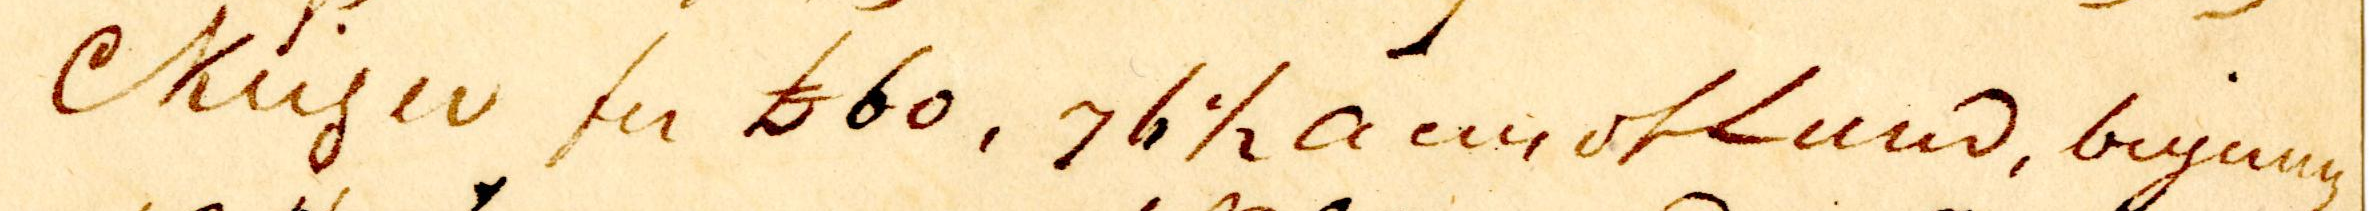C Kliger for £60. 76 1/2 acres of land, begining
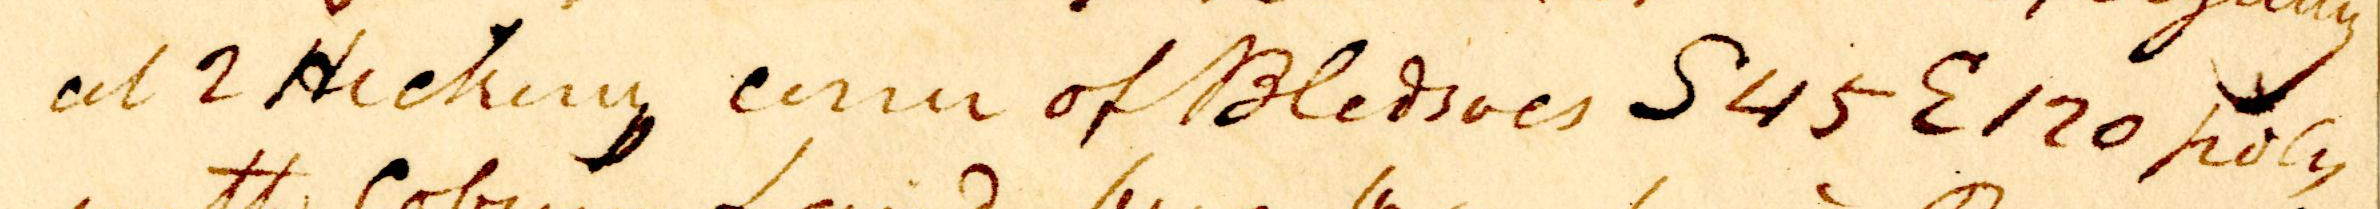at 2 Hickery canes of Bledsoes S45 E120 poles
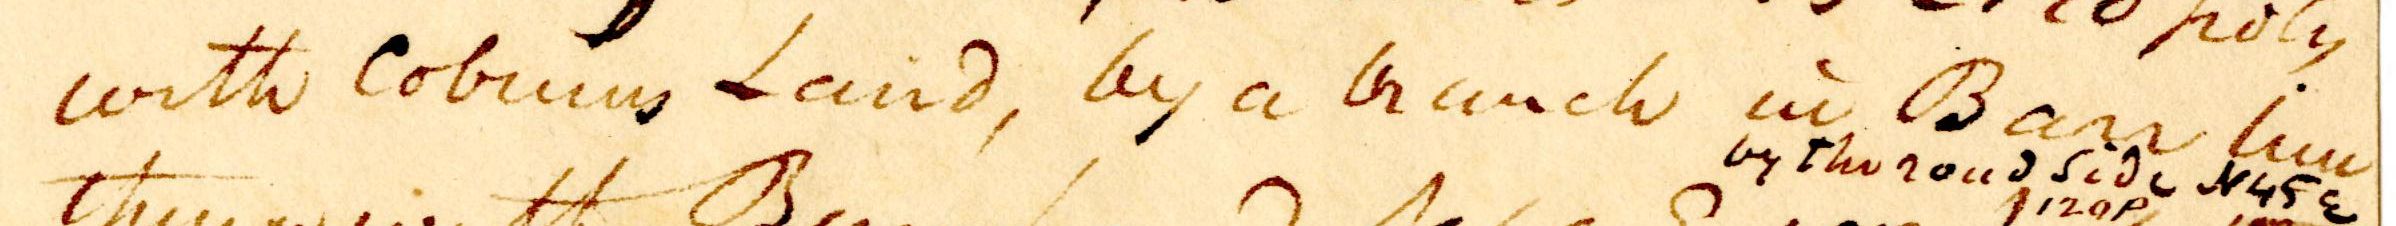with cobueus Land, by a branch in Barn line
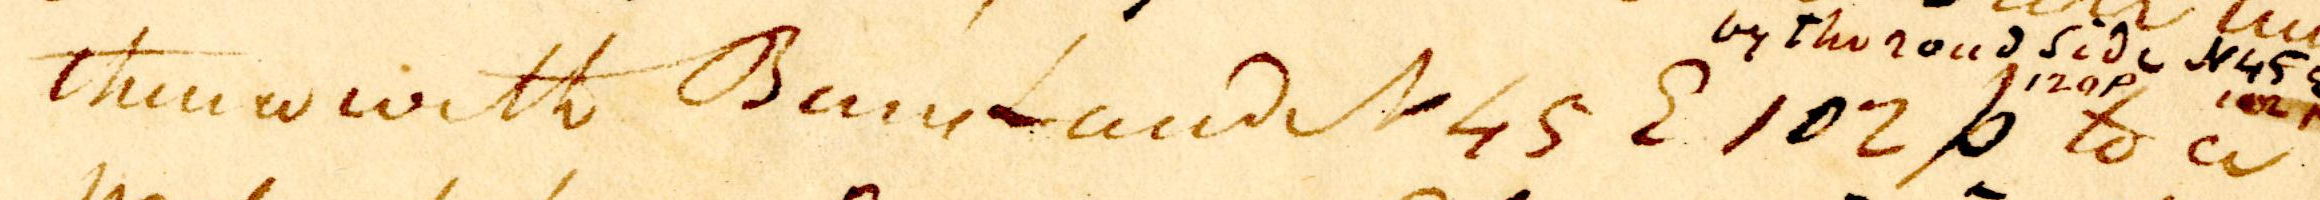thence with Barn Land N 45 E 102 p to a
